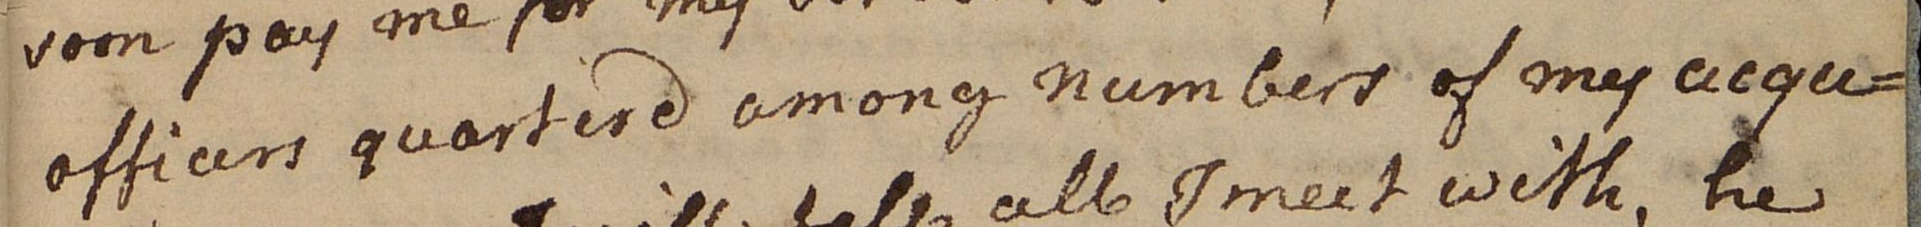officers quarterd among numbers of my acqu-
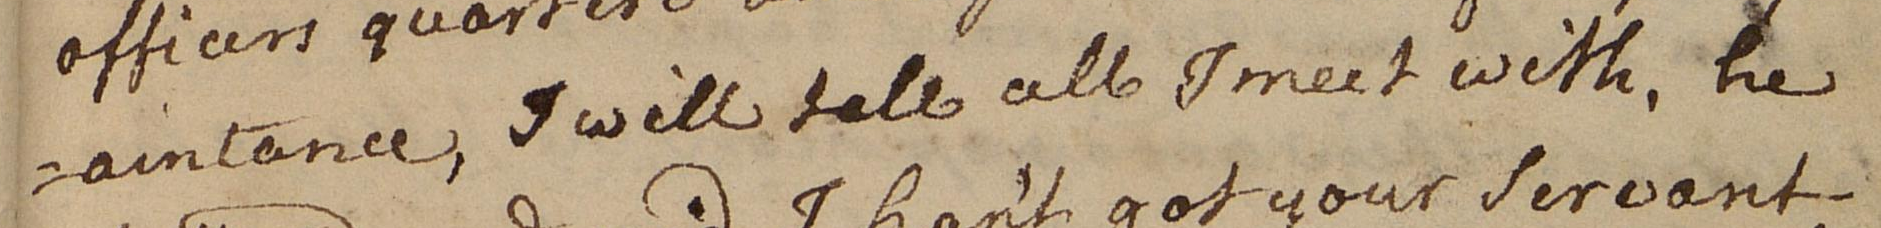-aintance, I well tall all Immeet with, he
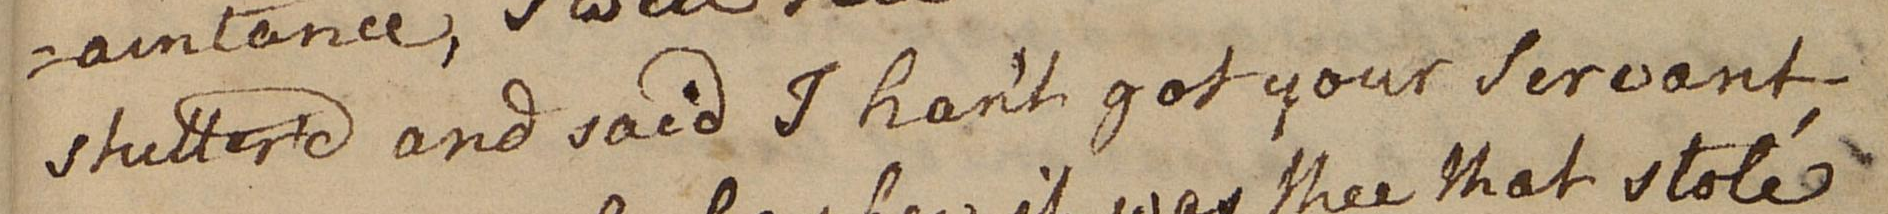stutter'd and said I han't got your Servant-
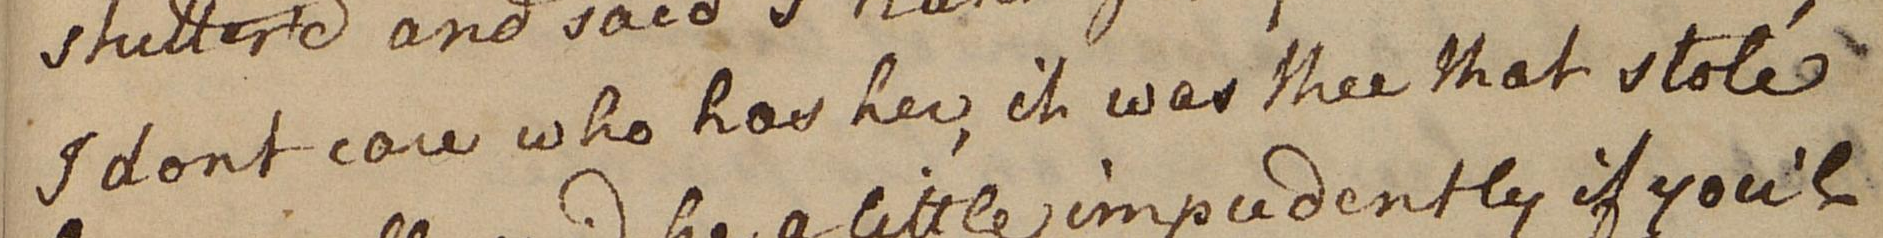I dont care who has her, it was thee that stole
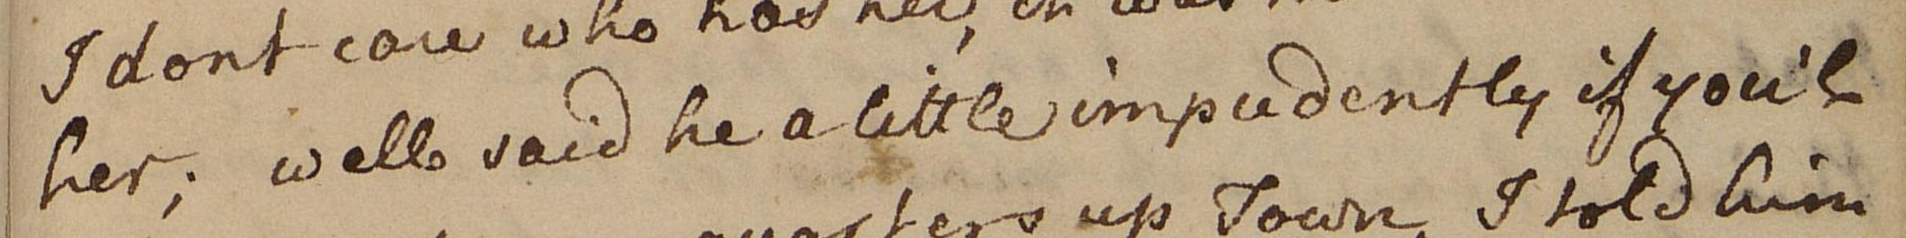her; well said he a little impudently if you'l
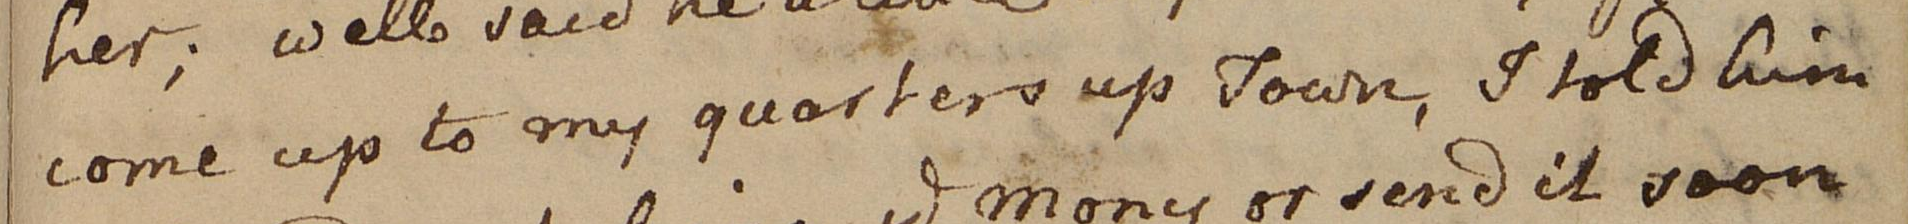come up to my quarters up Town, I told him
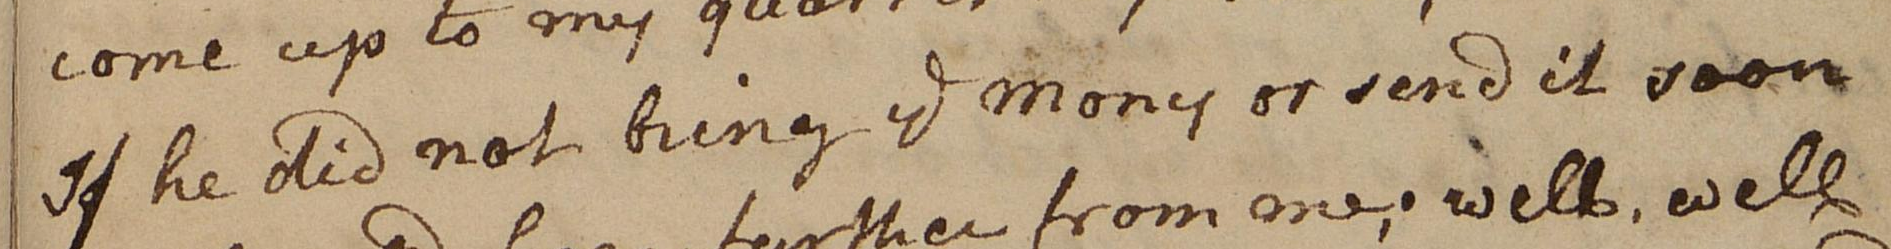If he did not bring y^e mony or send it soon
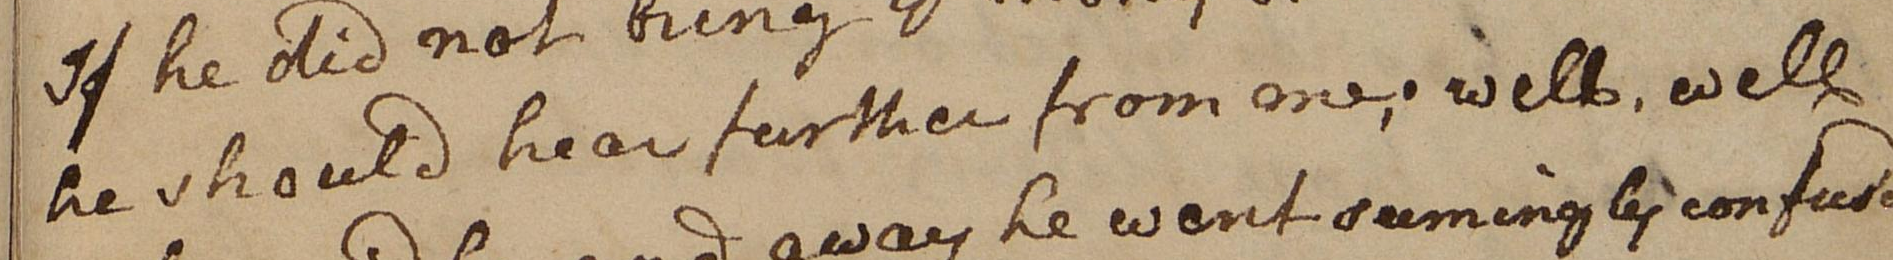he should hear further from me; well, well
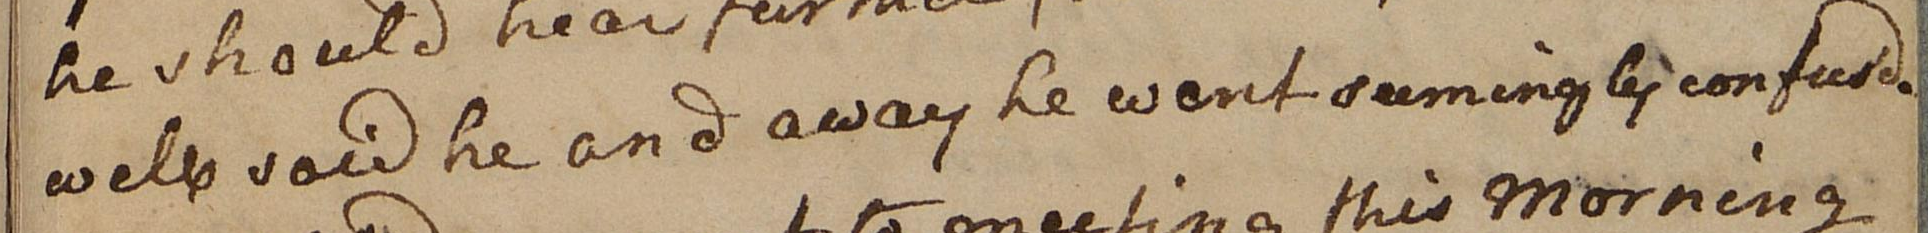well said he and away he went seemingly confus'd.
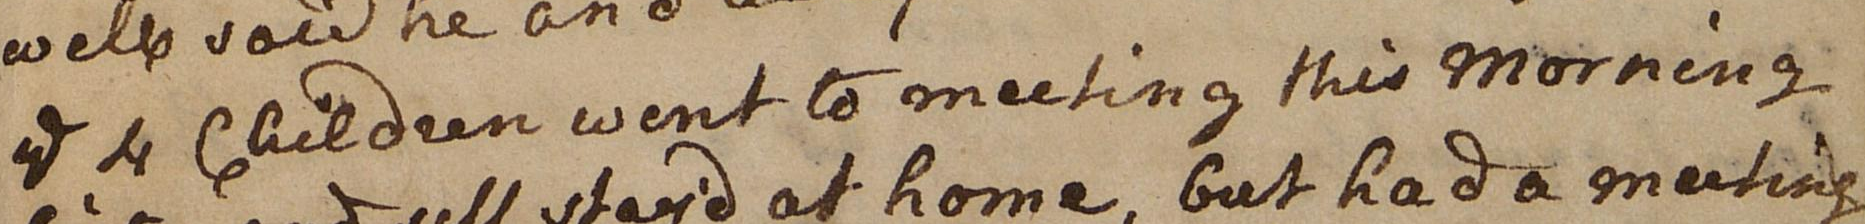y^e 4 Children went to meeting this morning
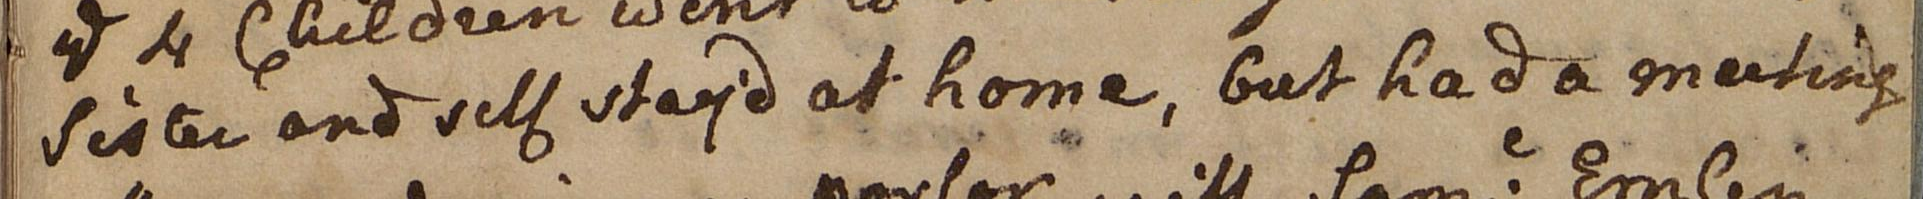Sister and self stay'd at home, but had a meeting
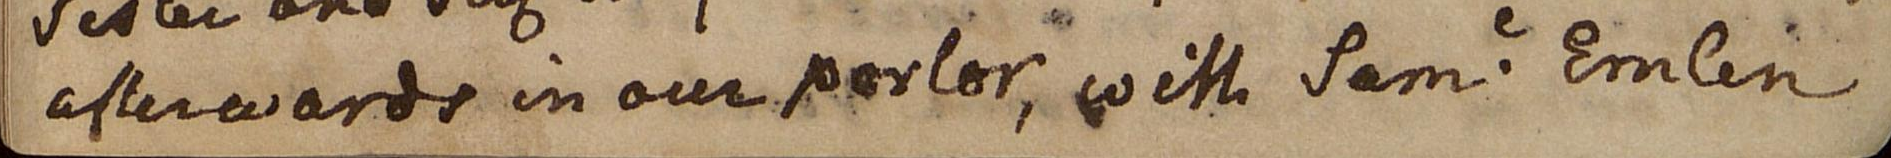afterwards in our parlor, with Sam^l. Emlen
